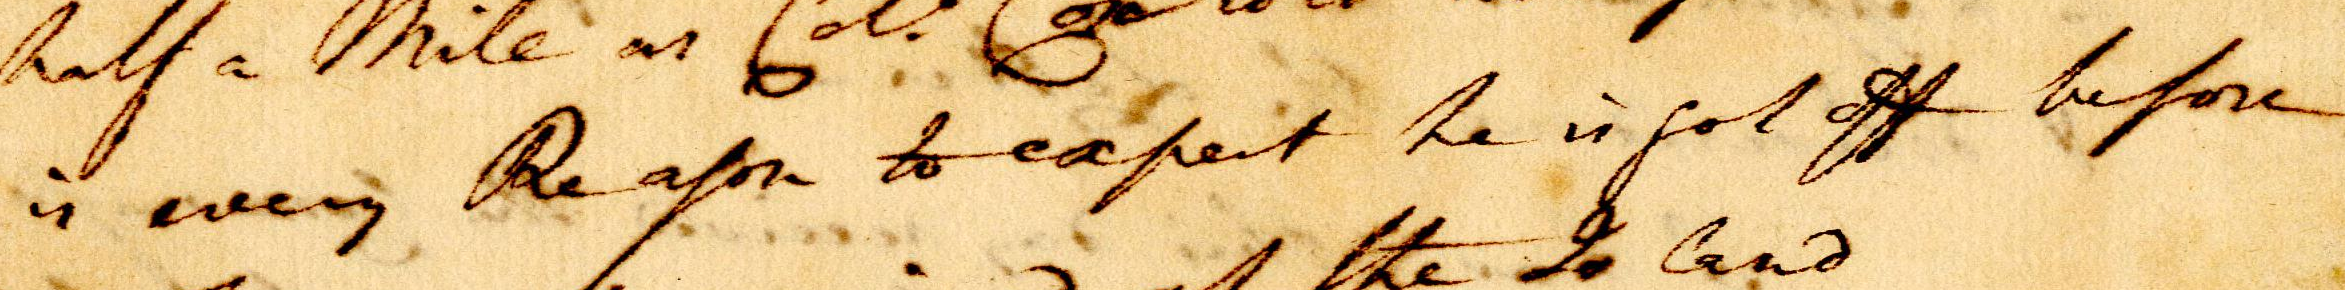is every Reason to expect he is sol off before
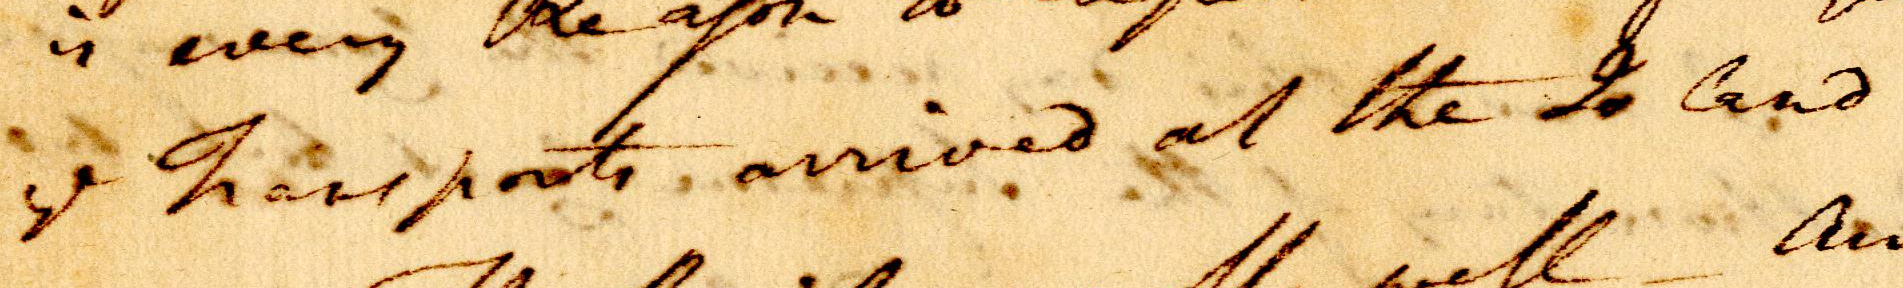y^e Transports arrived at the Island.
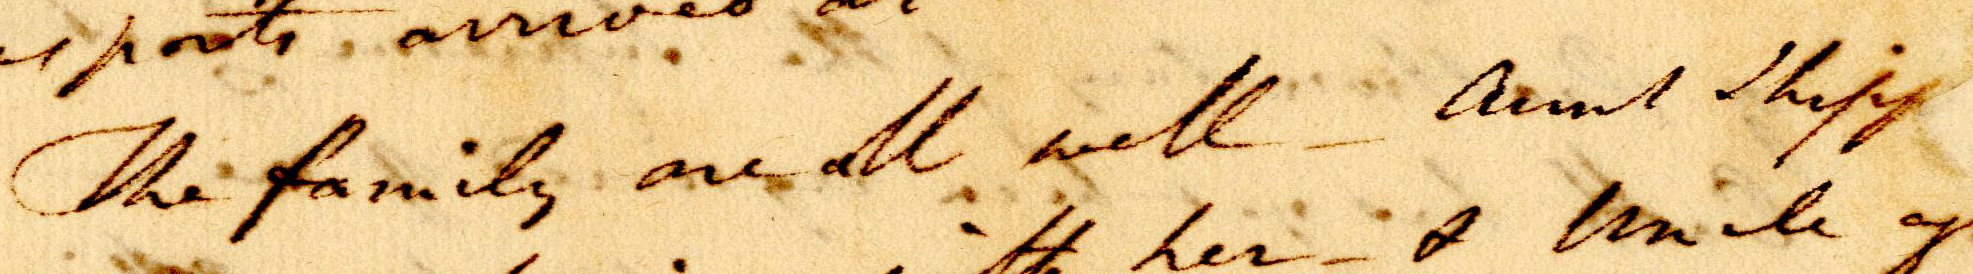The family are all well. Aunt Shipp-
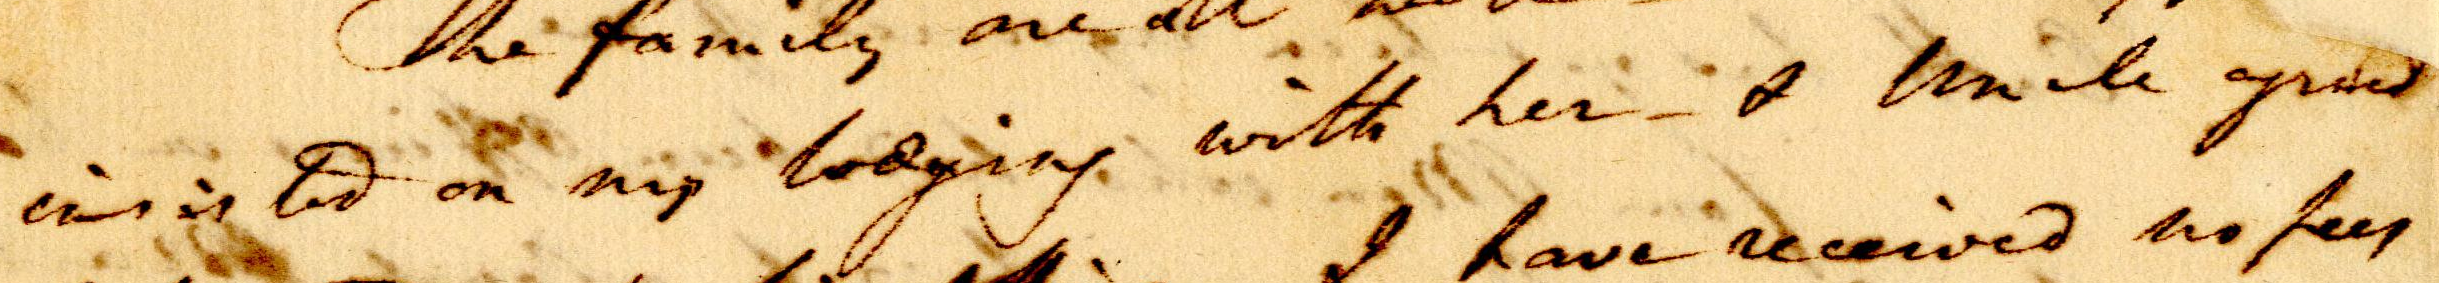-en is led on new lodging with her. & Uncle agreed
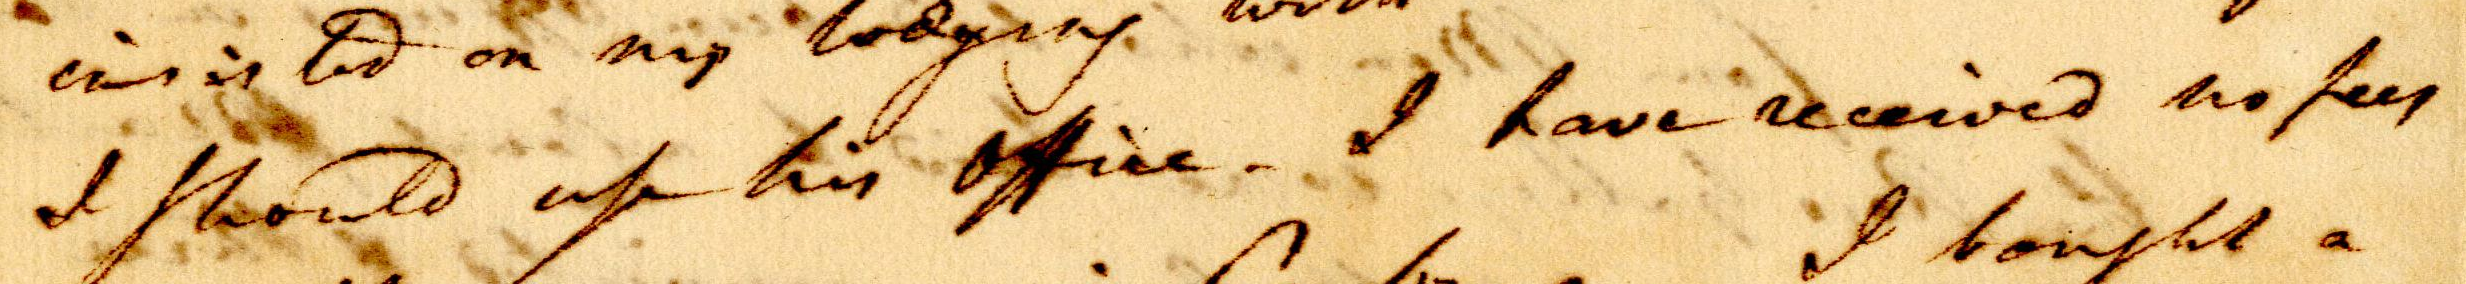I should up his office. I have received no fees
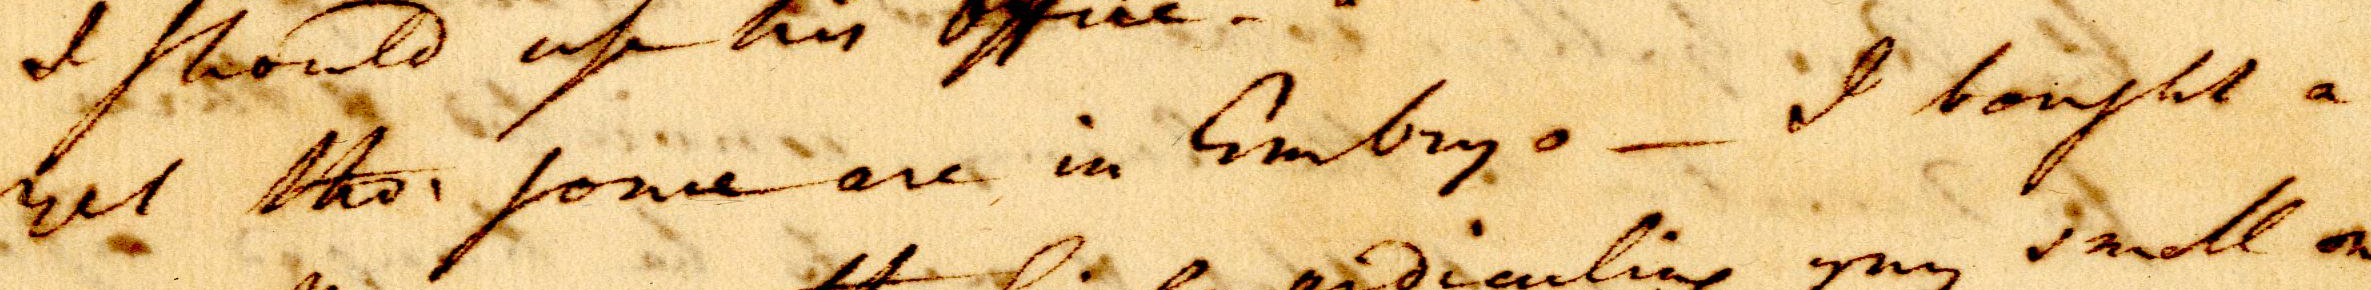yet tho' some are in Embryo. I bought a
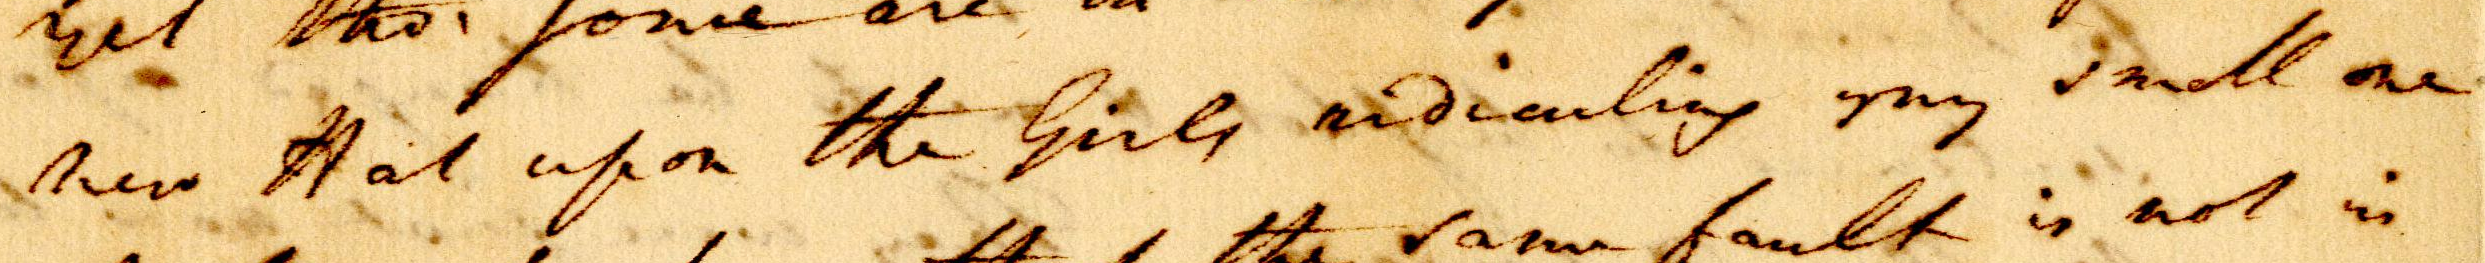new Hat upon the Girls ridiculing my small one
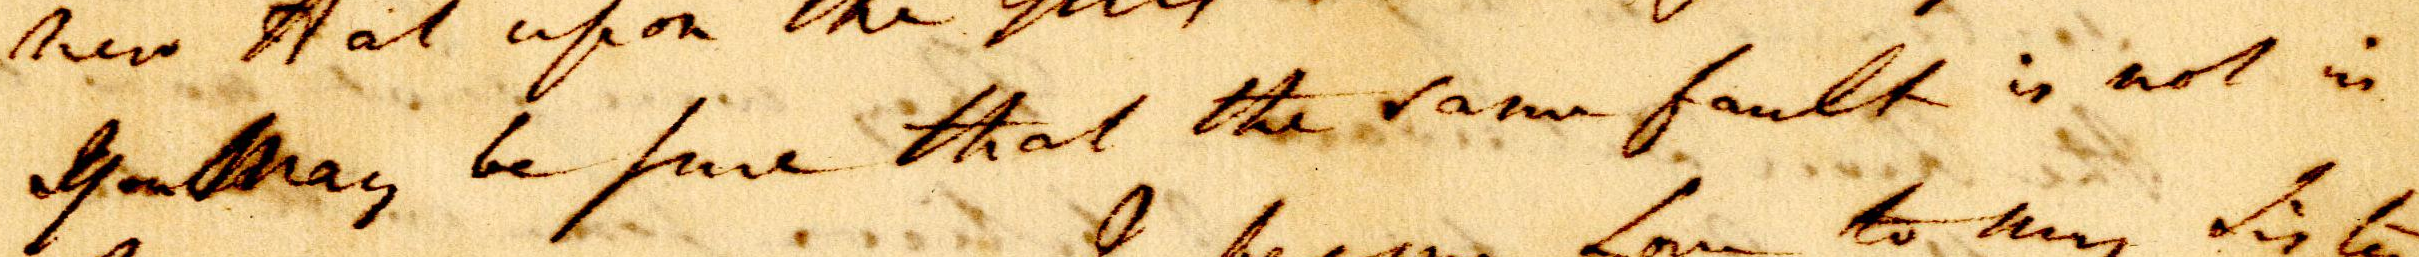You may be sure that the same fault is not in
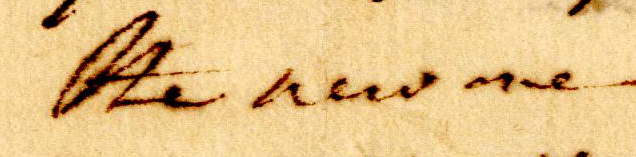the new one.
